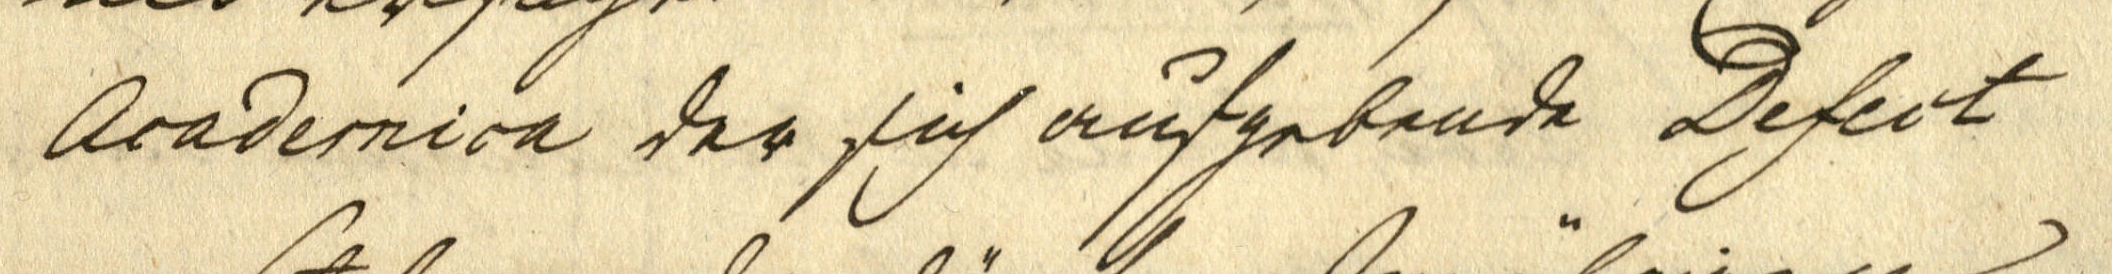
Academica der sich aufgebende Defect
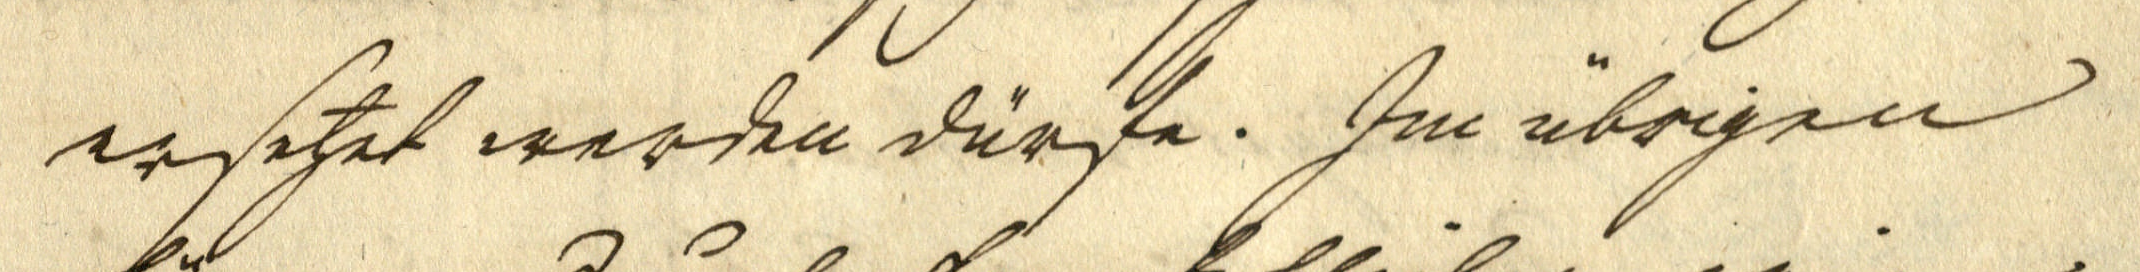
ersetzet werden dürfe. Im übrigen
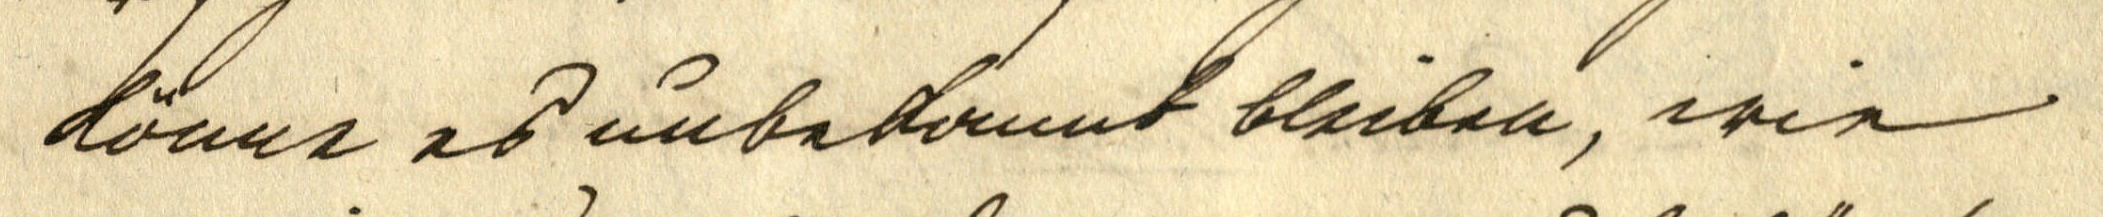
könne es unbekannt bleiben, wie
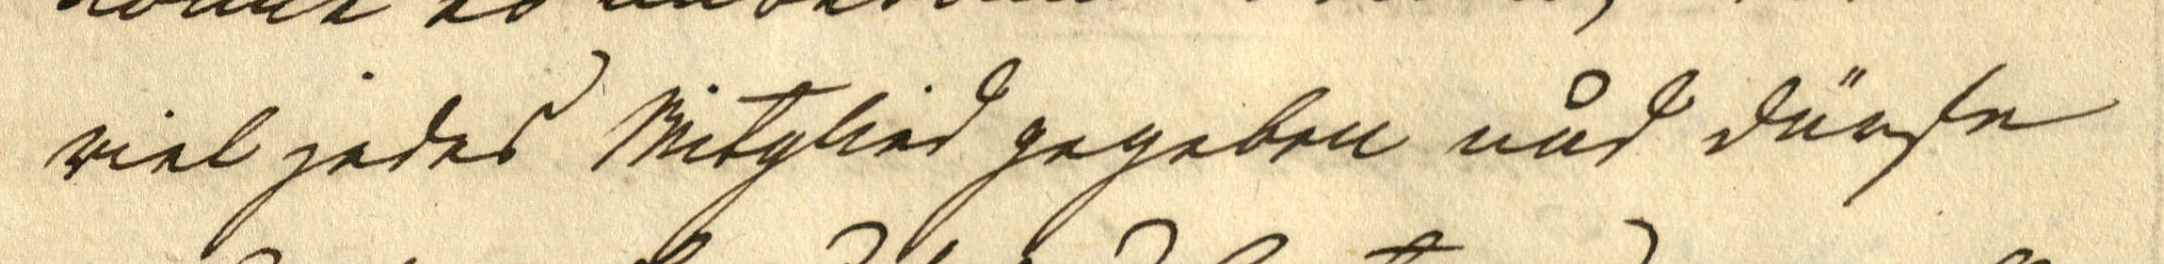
viel jedes Mitglied gegeben und dürfe
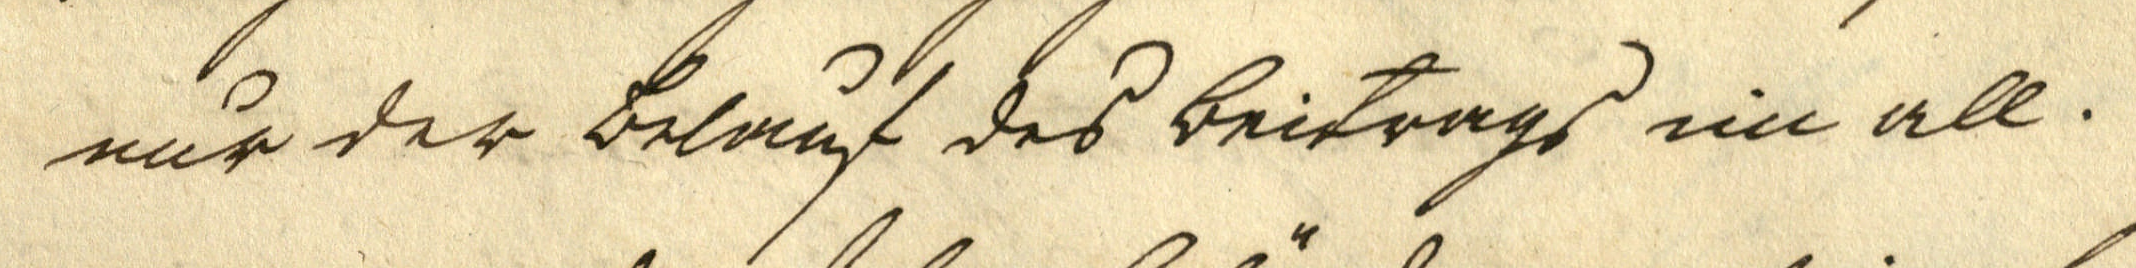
nur der Belauf des Beitrags im all-
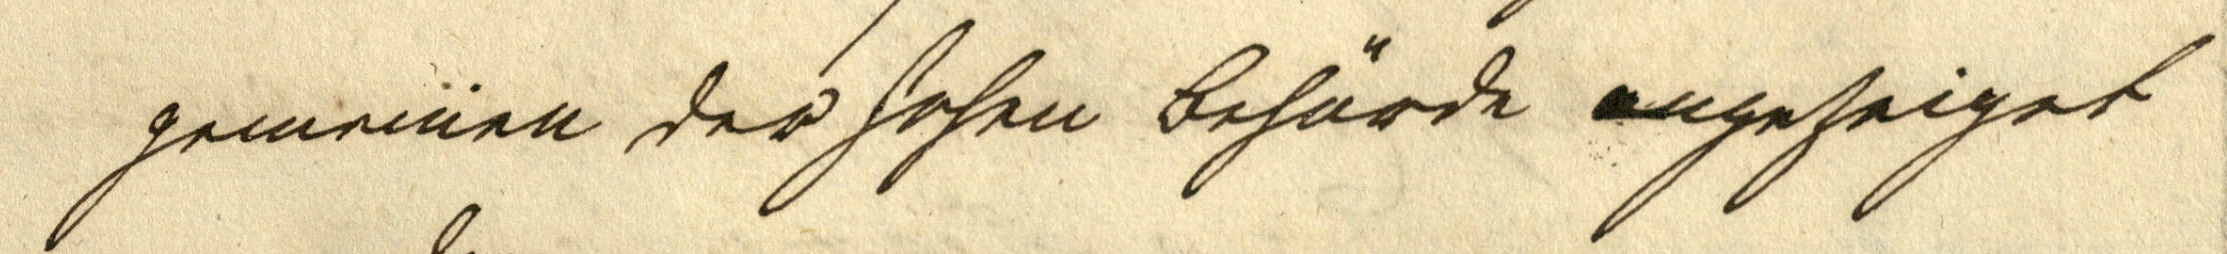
gemeinen der hohen Behörde angezeiget
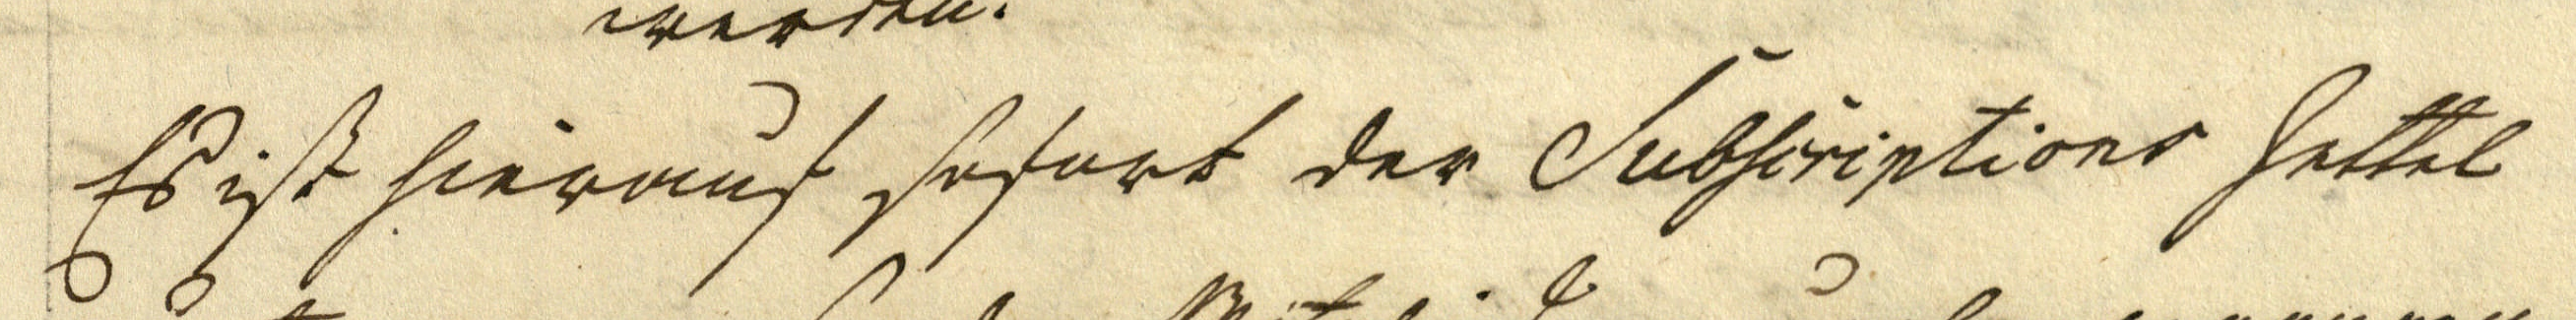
Es ist hierauf sofort der Subscriptions Zettel
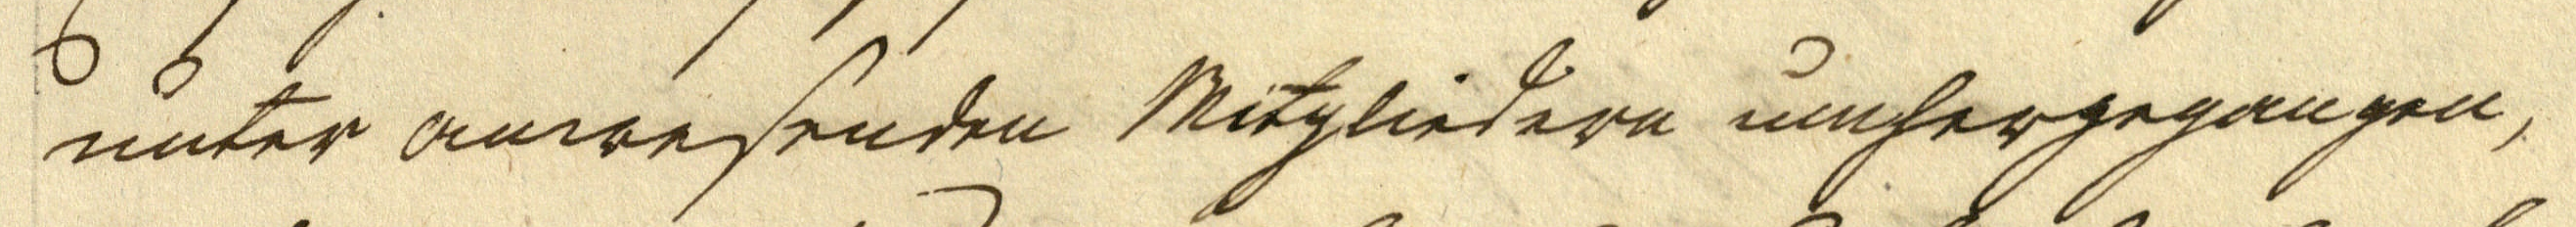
unter anwesenden Mitgliedern umhergegangen,
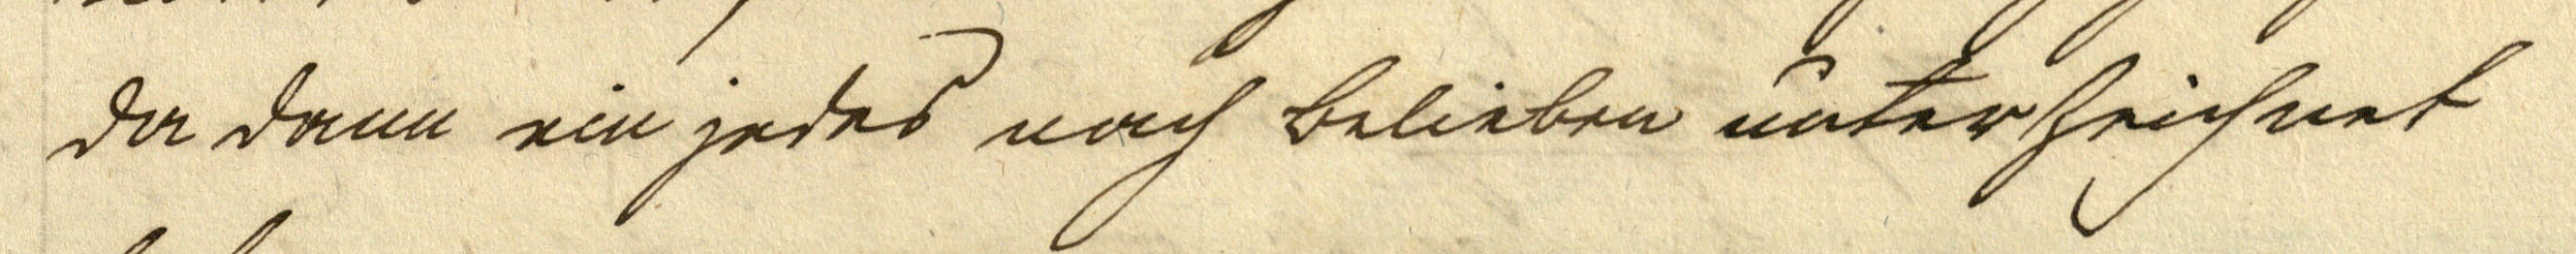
da dann ein jedes nach Belieben unterzeichnet
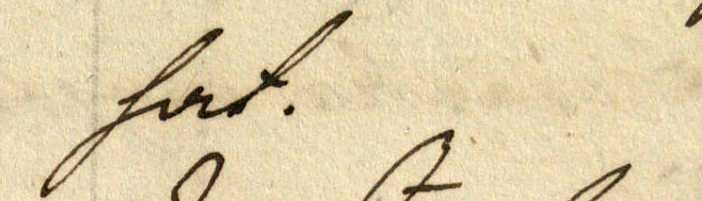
hat.
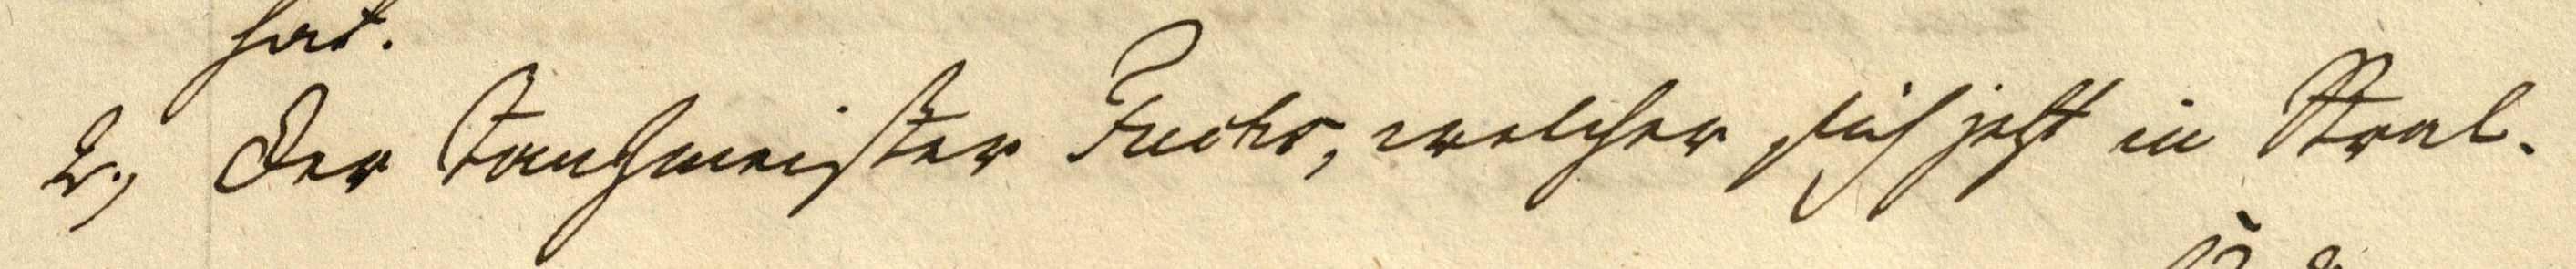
2. Der Tanzmeister Fuchs, welcher sich jetzt in Stral-
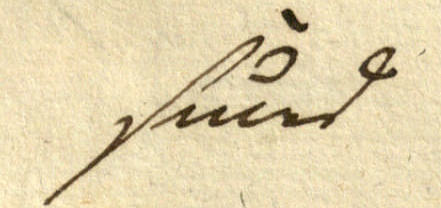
sund
